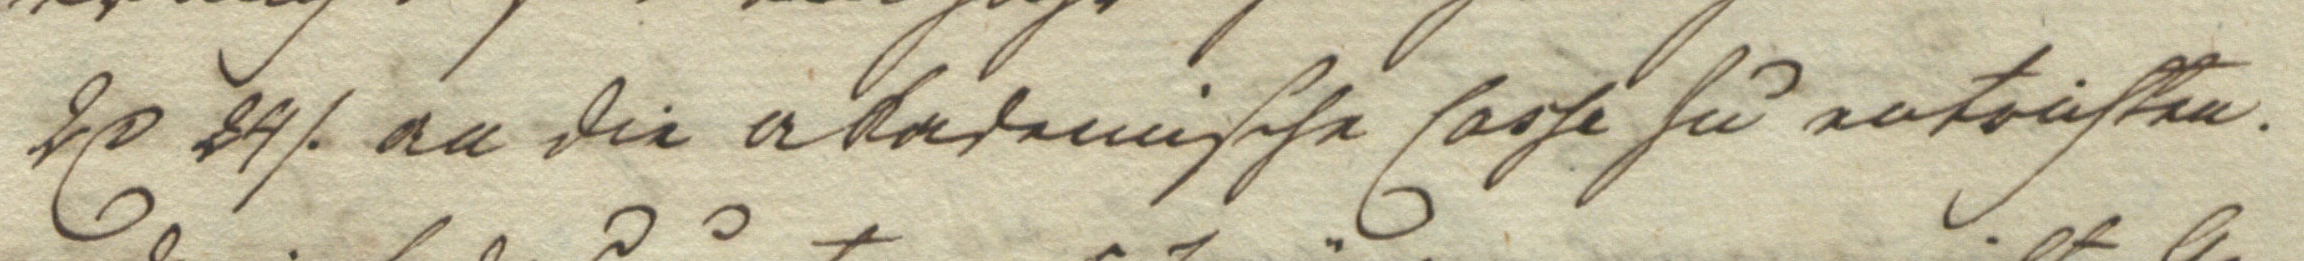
2 l. 24 s. an die akademische Casse zu entrichten.
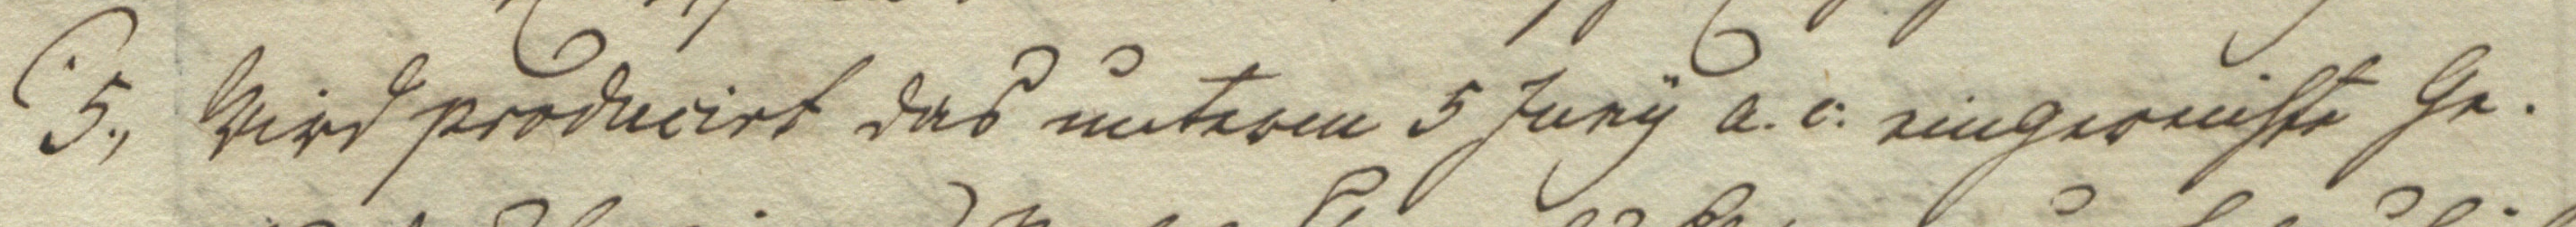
5., Wird producirt das unterm 5 Junÿ a. c. eingereichte Ge¬
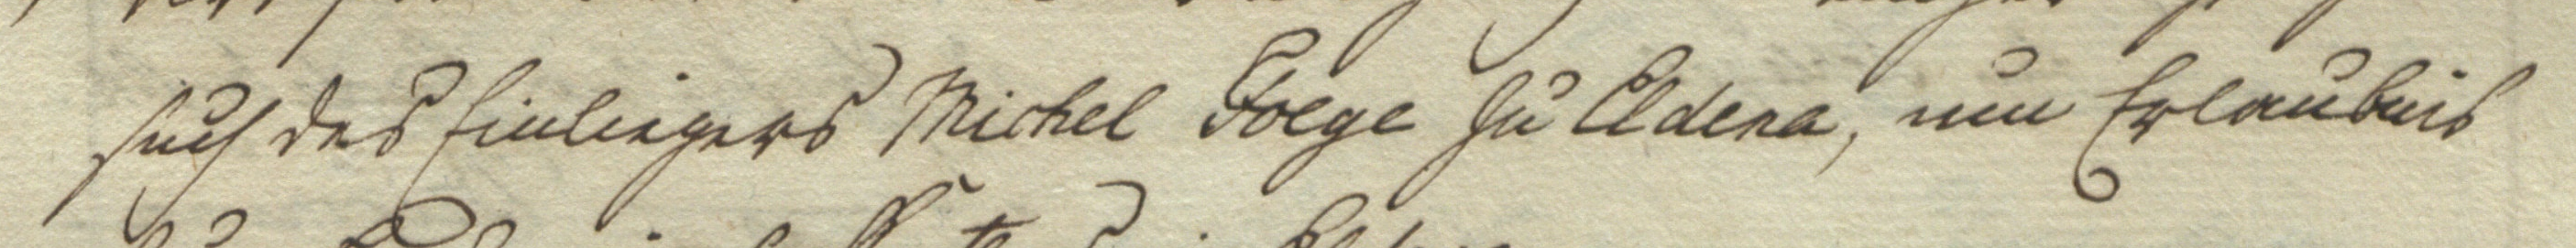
such des Einliegers Michel Folge zu Eldena, um Erlaubnis
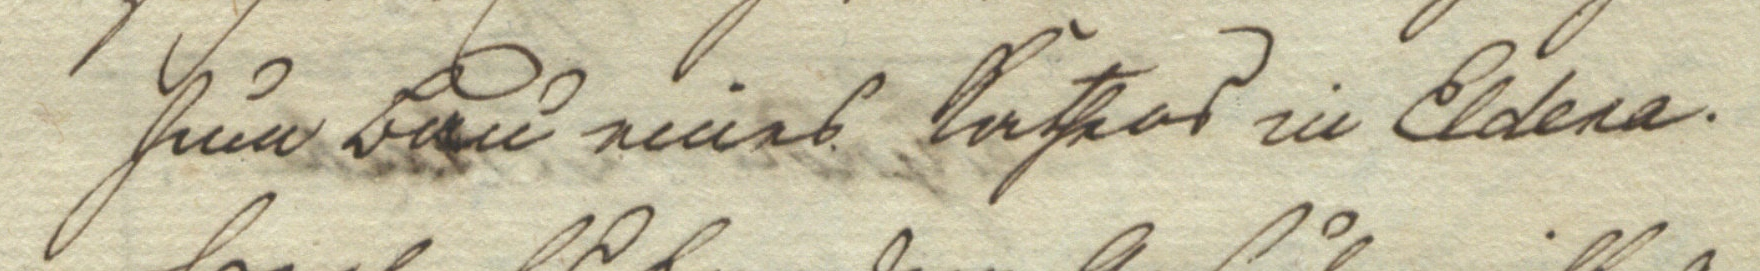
zum Bau eines Kathens in Eldena.
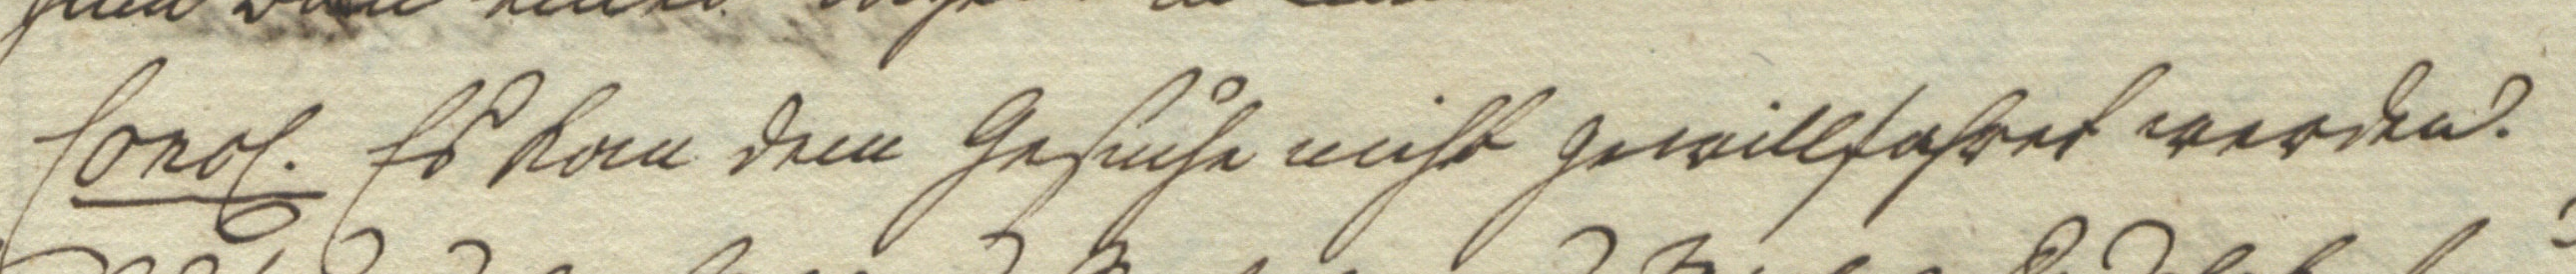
Concl. Es kan dem Gesuche nicht gewillfahret werden.
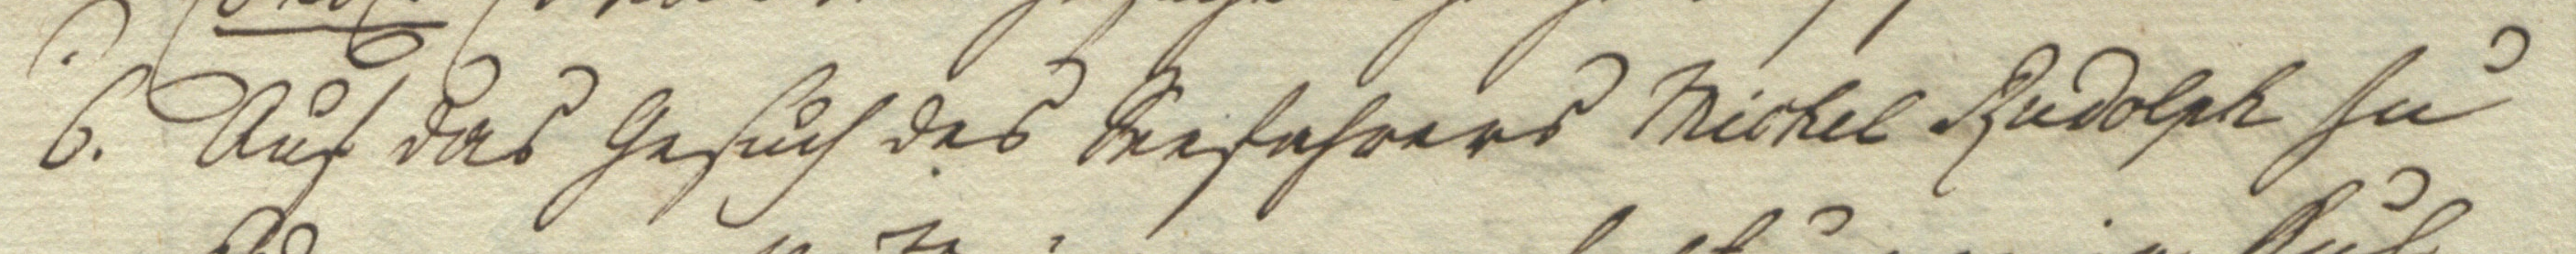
6. Auf das Gesuch des Seefahrers Michel Rudolph zu
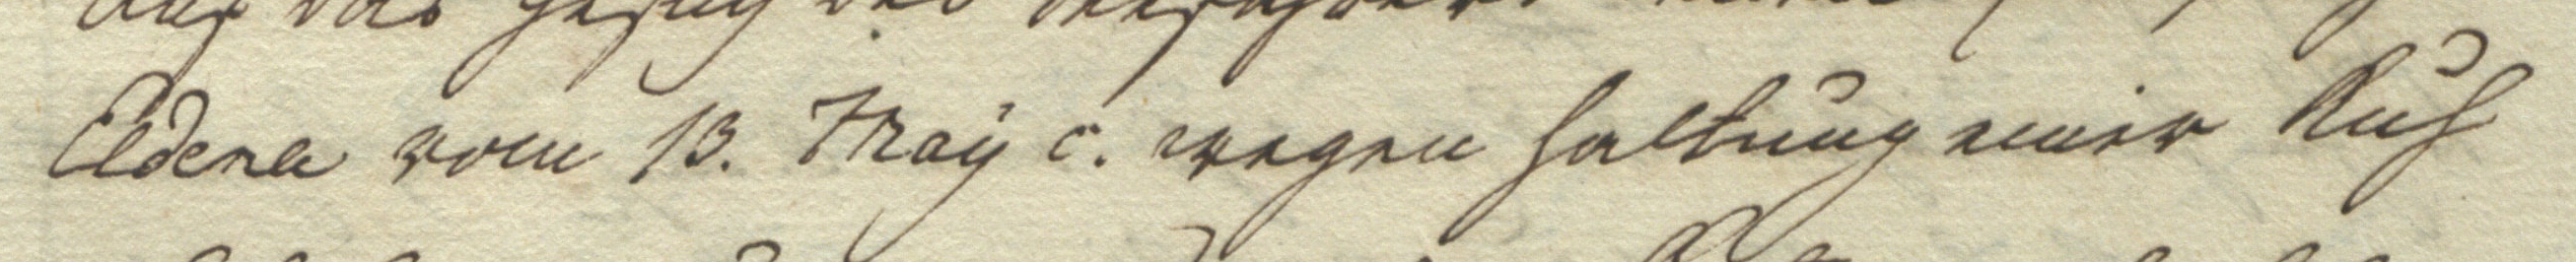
Eldena vom 10. Maÿ c. wegen Haltung einer Kuh
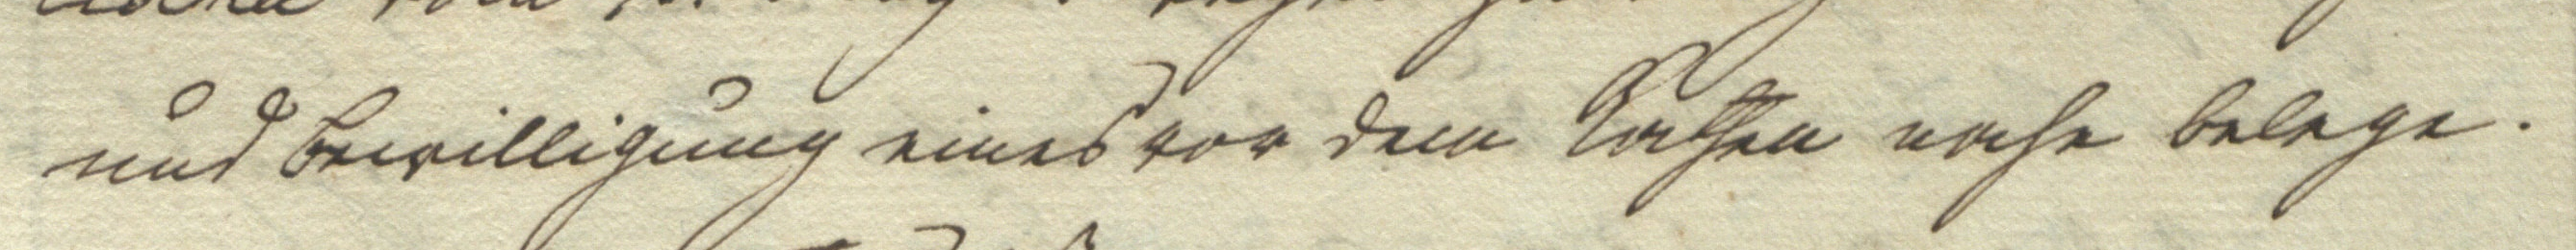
und Bewilligung eines vor dem Kathen nahe belege-
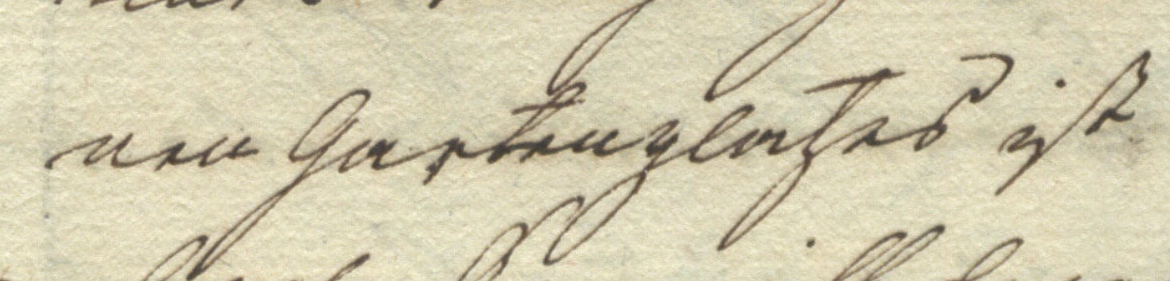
nen Gartenplatzes ist.
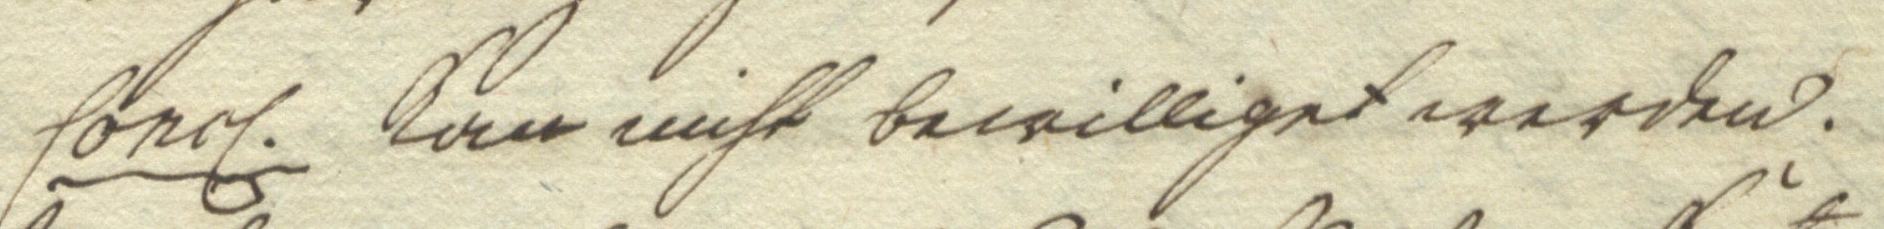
Concl. Kan nicht bewilliget werden.
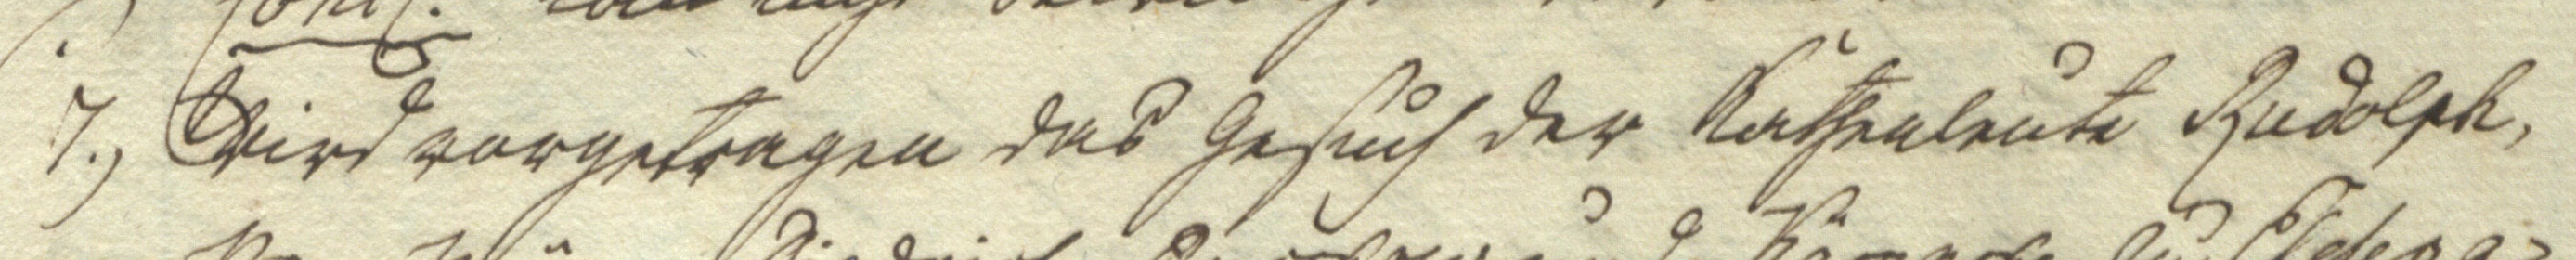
7., Wird vorgetragen das Gesuch der Kathenleute Rudolph,
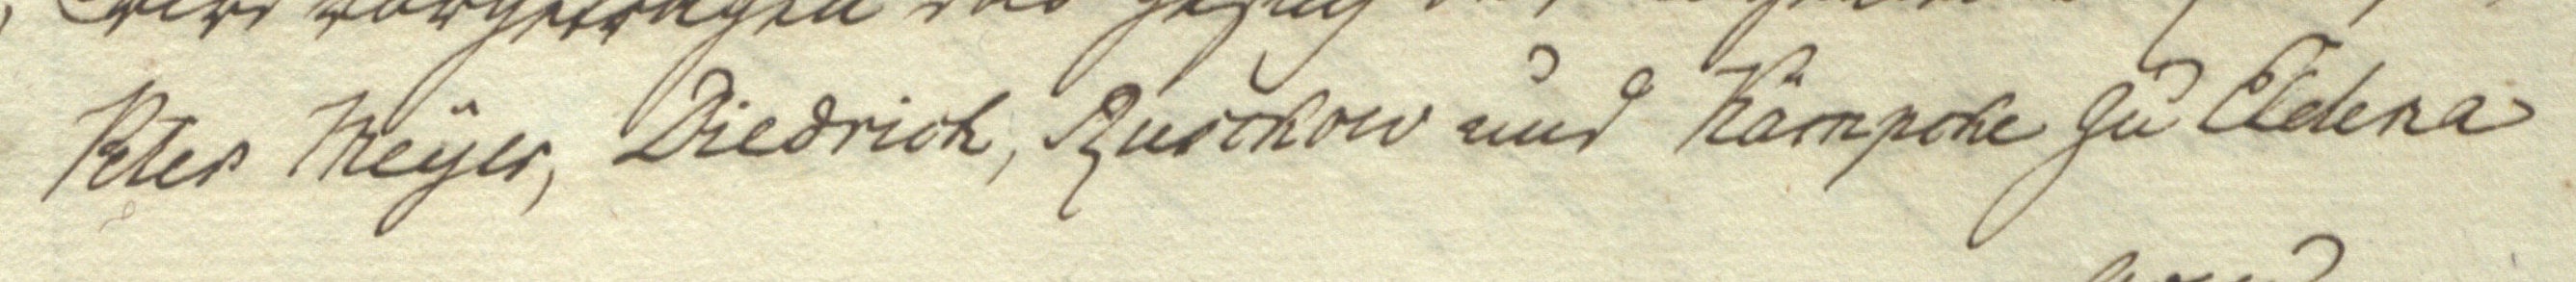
Peter Meÿer. Diedrich, Rucckow und Kämpcke zu Eldena
